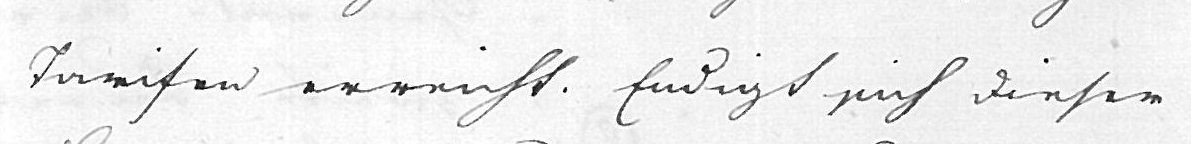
Tarifen erreicht. Endigt sich dieser
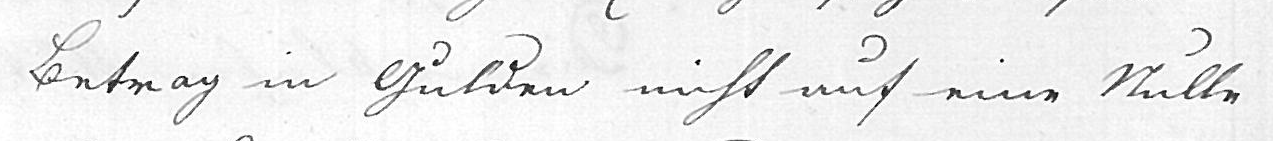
Betrag in Gulden nicht auf eine Nulle
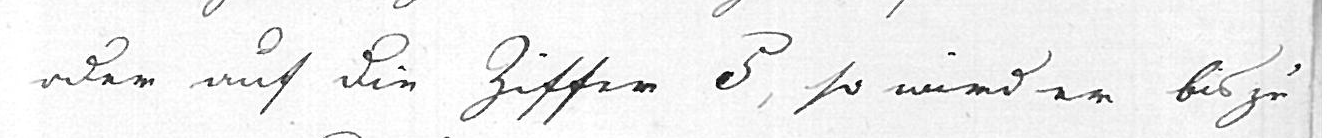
oder auf die ziffer 5, so wird er bis zu
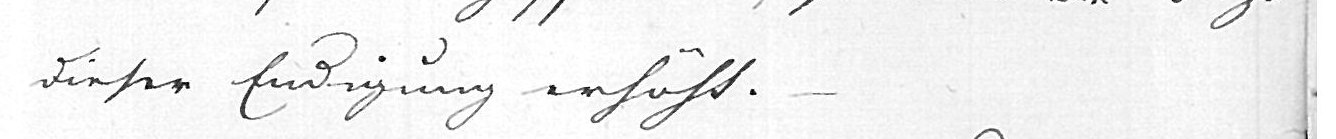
dieser Endigung erhöht.
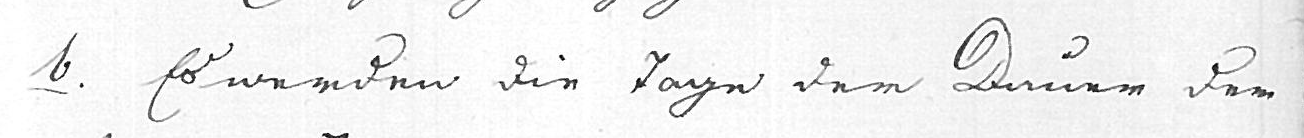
b. Es werden die Tage der Dauer der
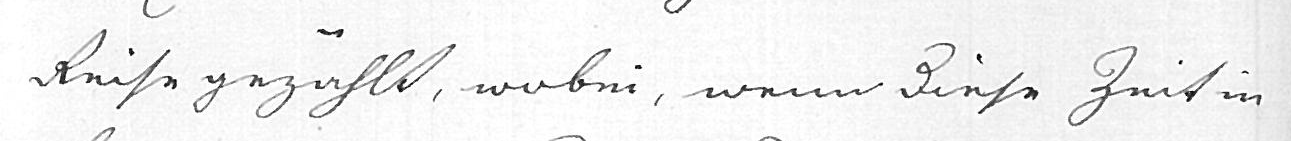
Reise gezählt, wobei, wenn diese Zeit in
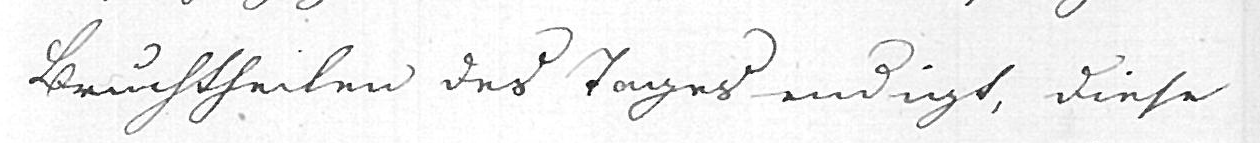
Bruchtheilen des Tages endigt, diese
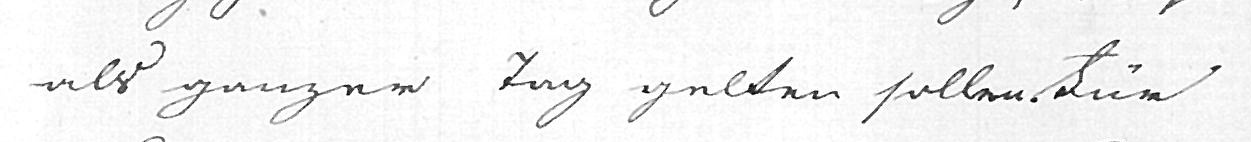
als ganzer Tag gelten sollen. Für
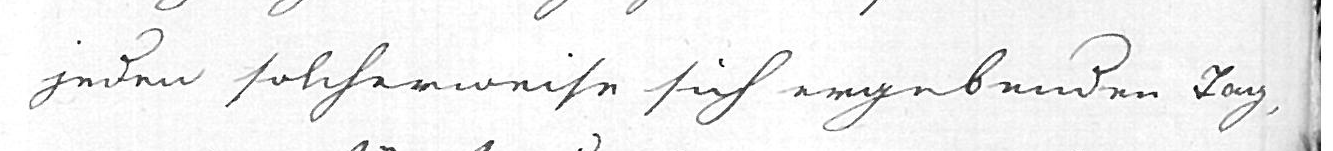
jeden solcherweise sich ergebenden Tag
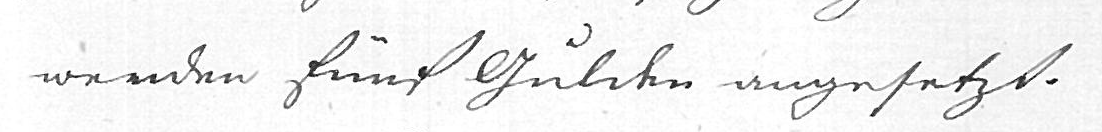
werden fünf Gulden angesetzt.
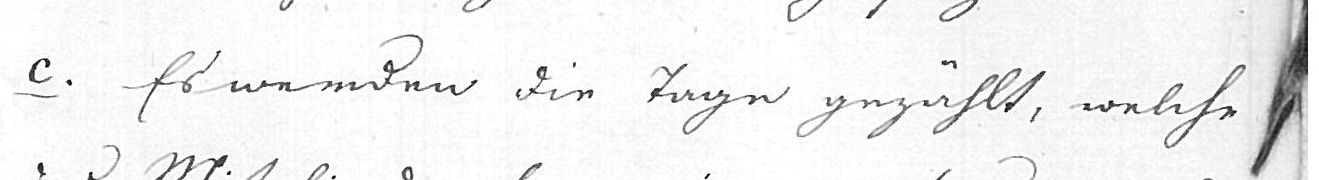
c. Es werden die Tage gezählt, welche
